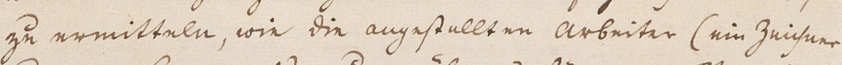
zu ermitteln, wie die angestellten Arbeiter (ein Zeichner
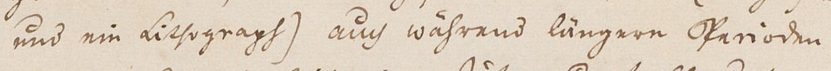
und ein Lithograph) auch während längern Perioden
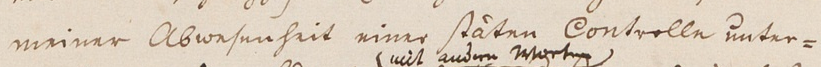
meiner Abwesenheit einer stäten Controlle unter-
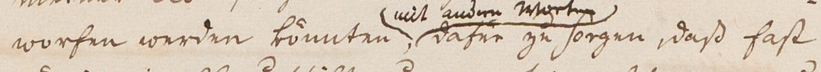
worfen werden könnten, mit andern Worten dafür zu sorgen, daß fast
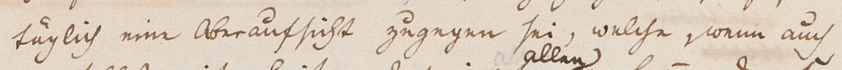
täglich eine Oberaufsicht zugegen sei, welche, wenn auch
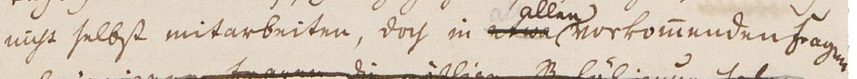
nicht selbst mitarbeiten, doch in etwaallen vorkommenden Fragen
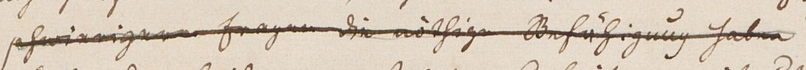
schwierigen Fragen die nöthige Befähigung haben
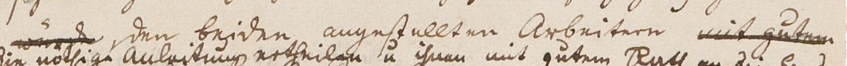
würde den beiden angestellten Arbeitern mit gutem
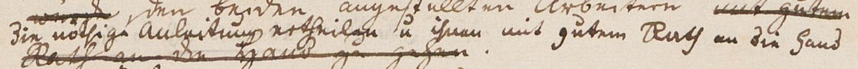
die nötige Anleitung ertheilen u ihnen mit gutem Rath an die Hand
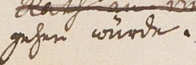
gehen würde.
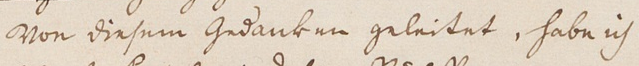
Von diesem Gedanken geleitet, habe ich
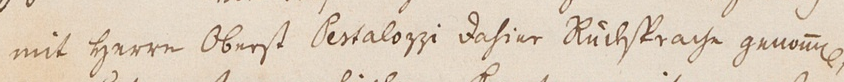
mit Herrn Oberst Pestalozzi dahier Rücksprache genommen,
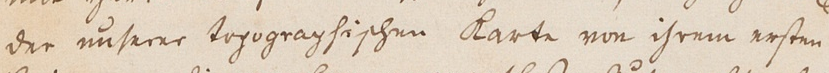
der unserer topographischen Karte von ihrem ersten
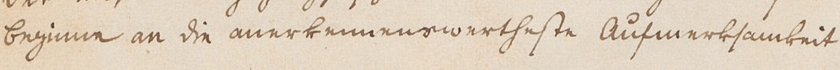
Beginne an die anerkennenswertheste Aufmerksamkeit
